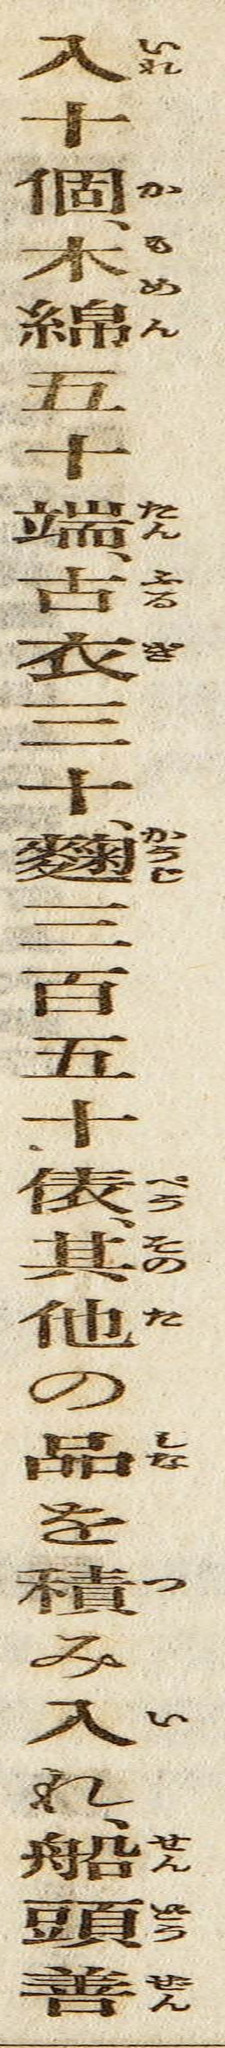入十個、木綿五十端、古着三十、麹三百五十俵其他の品を積み入れ、船頭善
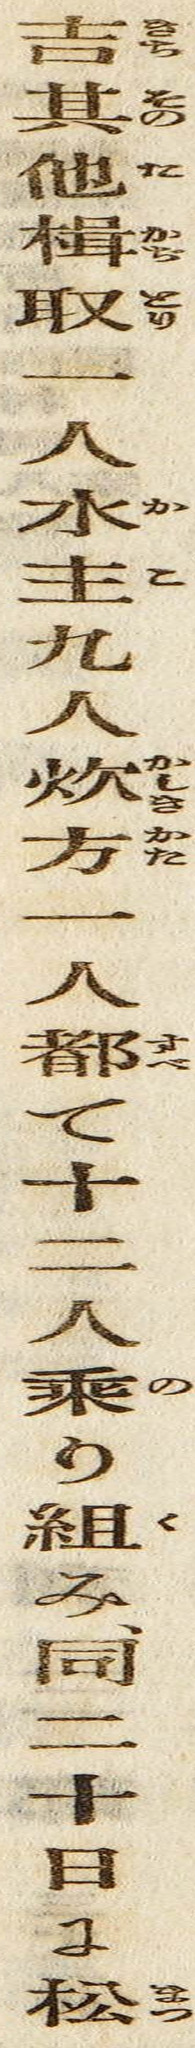吉其他楫取一人水主都て十二人乗り組み、同二十日に松
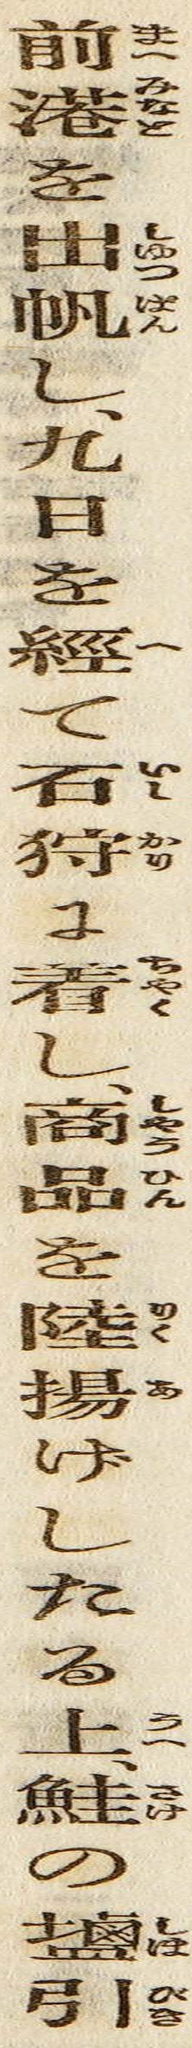前港を出帆し、九日を経て石狩に着し、商品を陸揚げしたる上、鮭の塩引
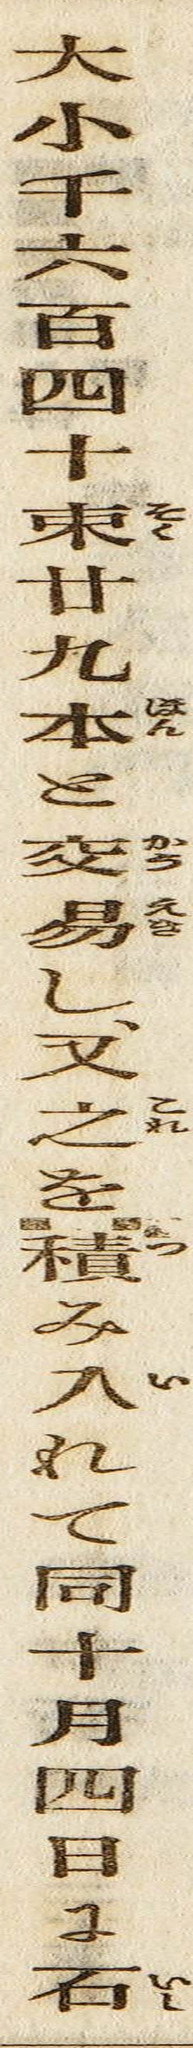大小千六百四十束廿九本と交易し、又之を積み入れて同十月四日に石
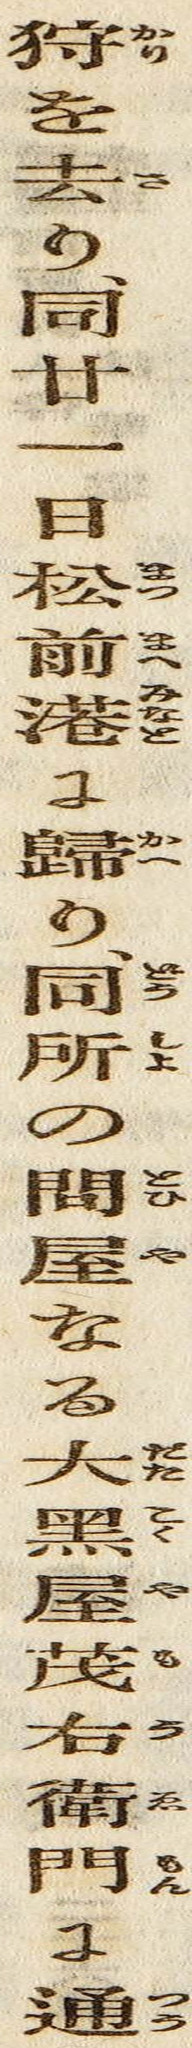狩を去り、同廿一日松前港に帰り、同所の問屋なる大黒屋茂右衛門に通
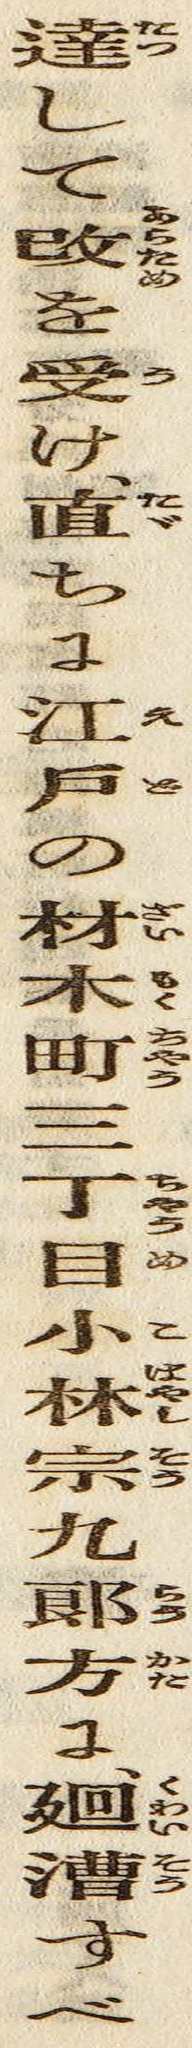達して改を受け、直ちに江戸の材木町三丁目小林宗九郎方に廻漕すべ
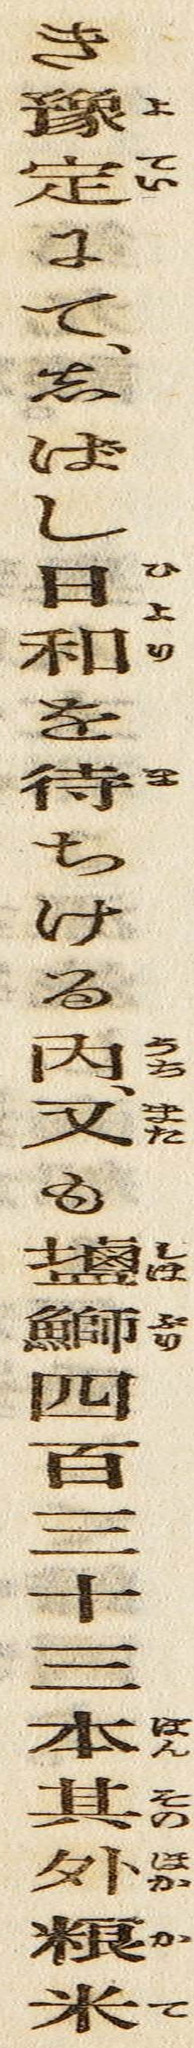き予定にて、しばし日和を待ちける内、塩鰤四百三十三本其外糧米
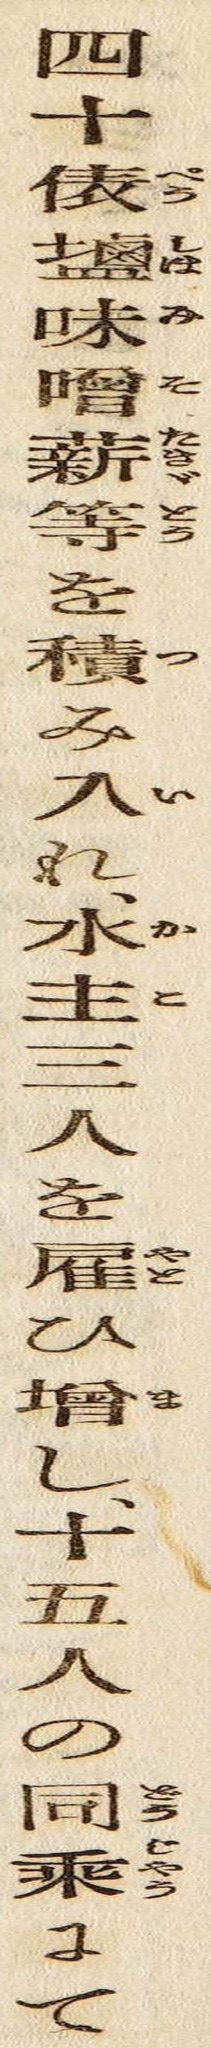四十俵塩味噌薪等を積み入れ、水主三人を雇ひ増し、十五人の同乗（どうじや
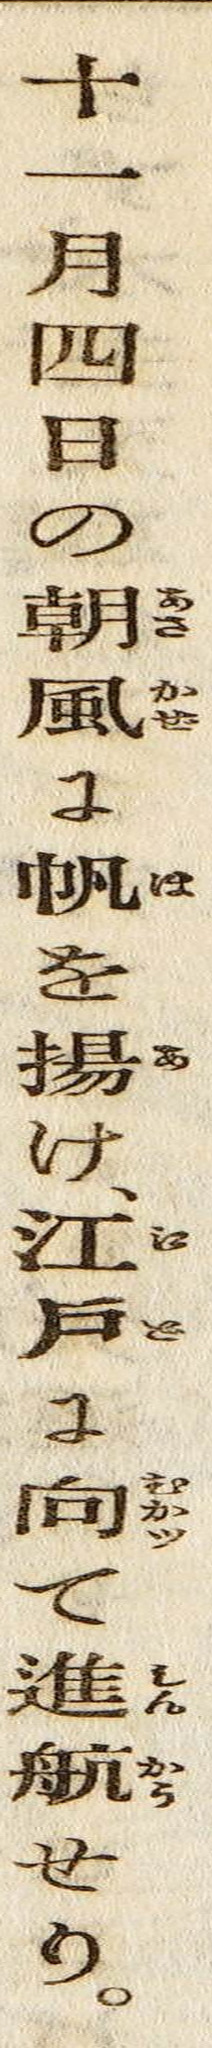十一月四日の朝風に帆を揚け、江戸に向て進航せり。
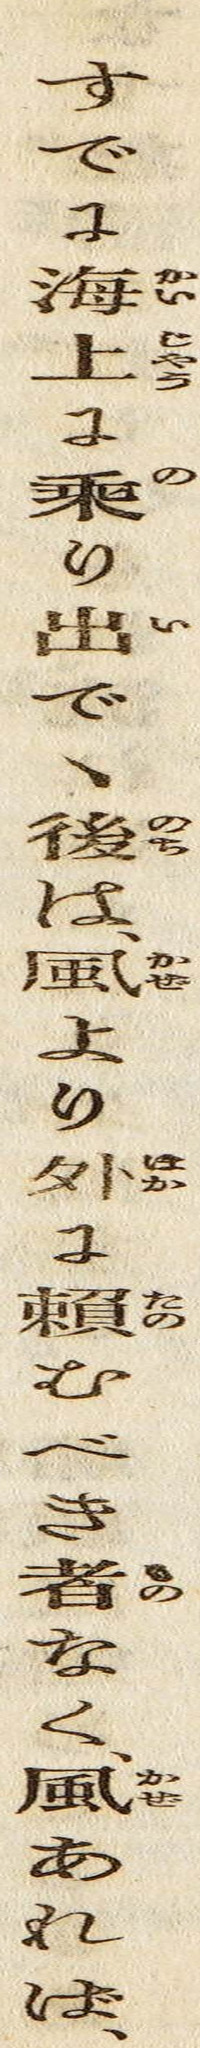すでに海上に乗り出でゝ後は、風より外に頼むべき者なく風あれば、
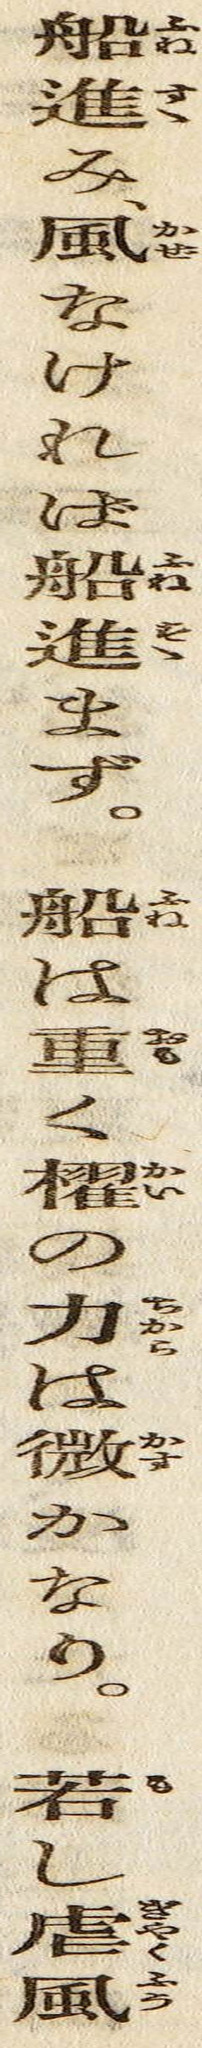船進み、風なければ船進まず。船は重く櫂の力は微かなり。若し逆風
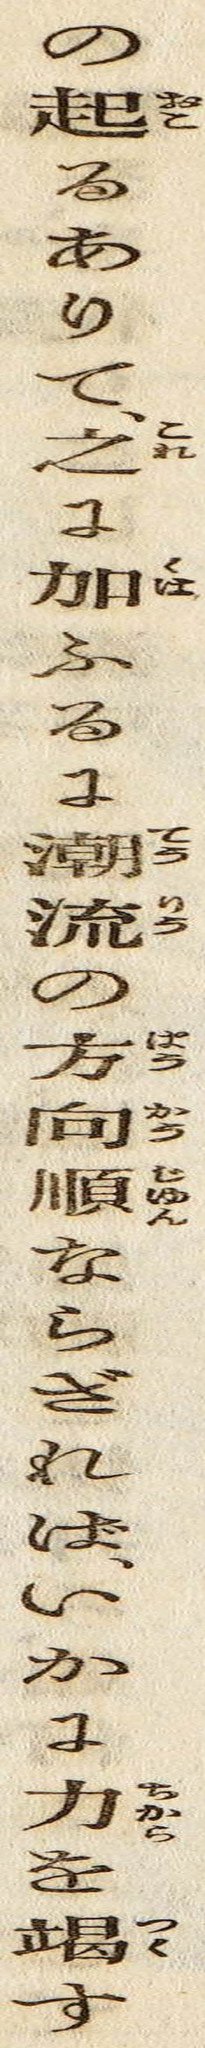の起るありて、之に加ふるに潮流の方向順ならざれば、いかに力を竭す
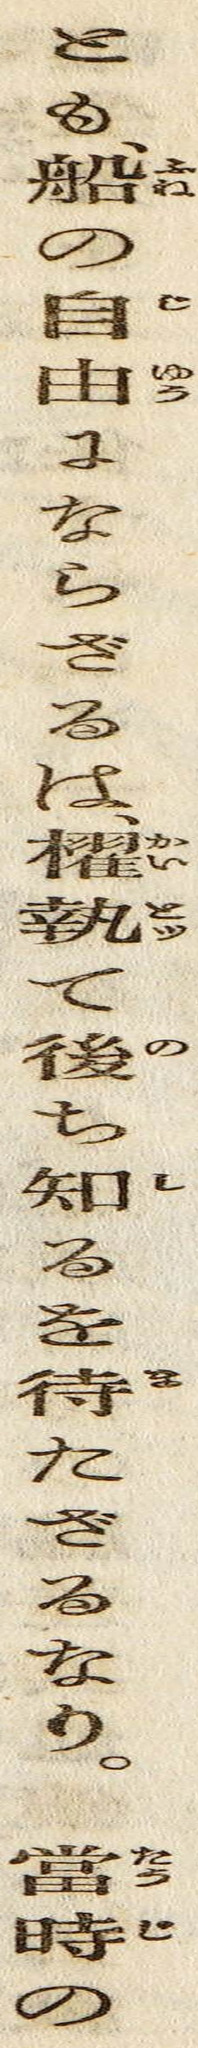とも、船の自由にならざるは、櫂執て後ち知るを待たざるなり。当時の
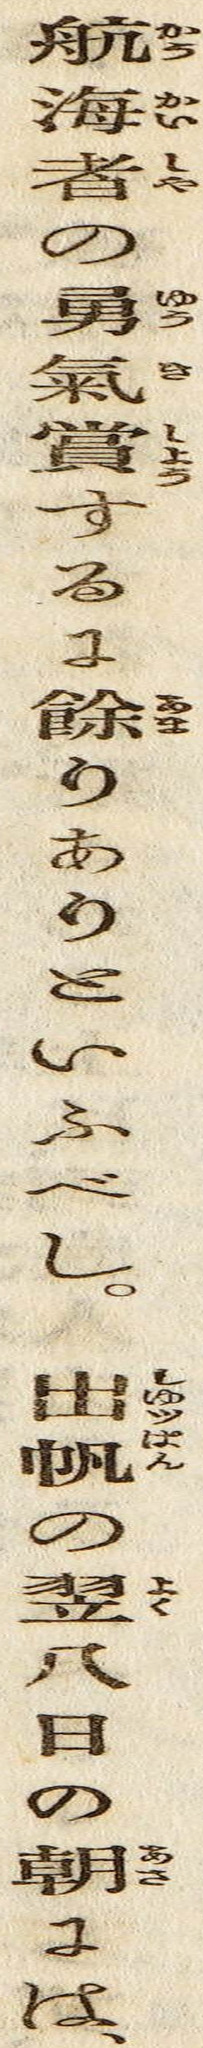航海者の勇気賞するに余りありといふべし、出帆の翌八日の朝には、
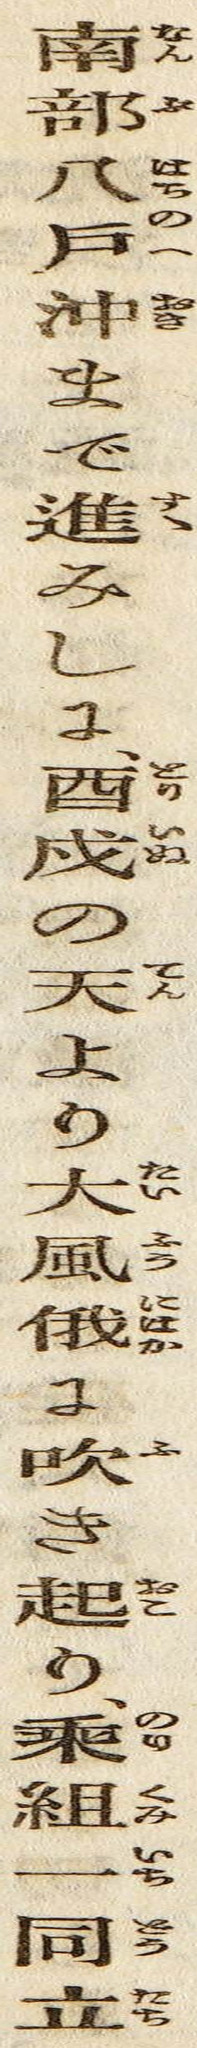南部八戸沖まで進みしに、酉戌の天より大風俄に吹き起り、乗組一同立
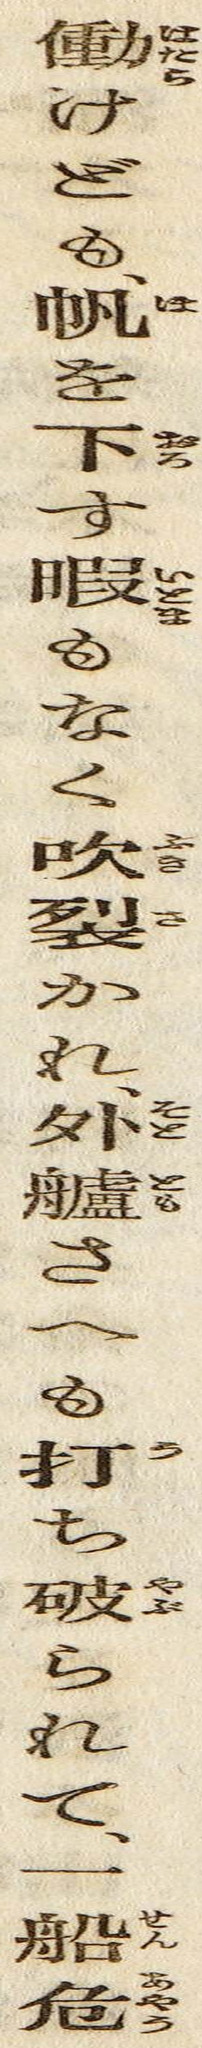働けども、帆を下す暇もなく吹裂かれ、外艫さへも打ち破られて、一船危
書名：日本漂流譚
